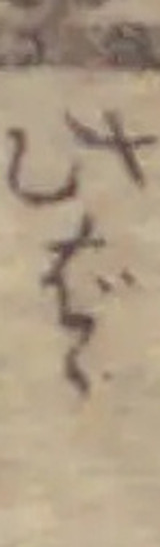此ばゞ
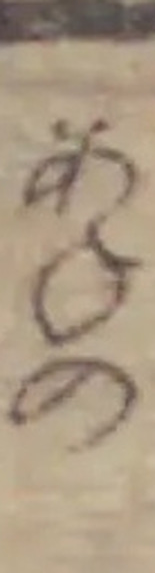あねの
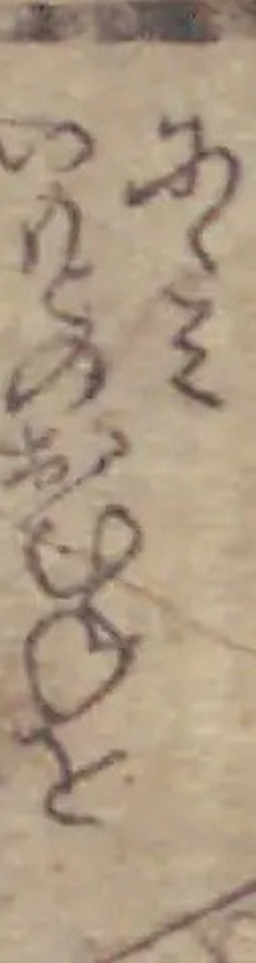いもとのおむねを
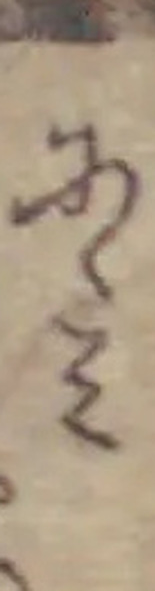にくみ
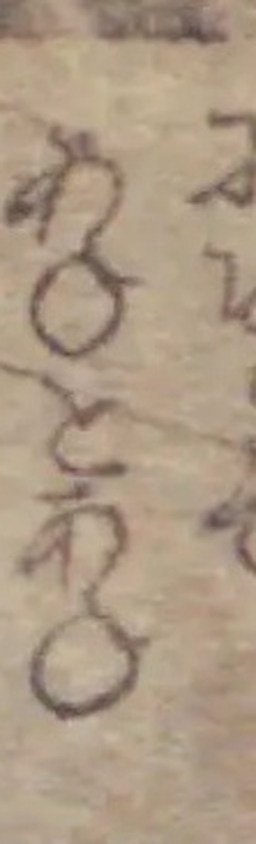あねをあね
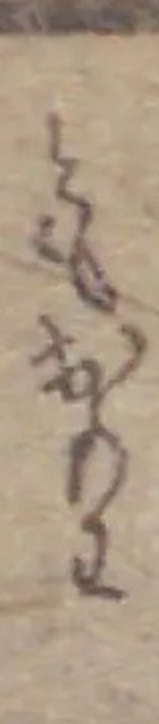ともおもわ

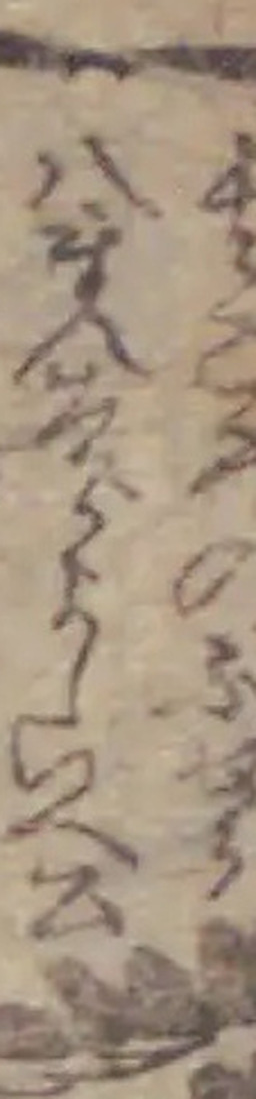八まん太郎よしいへ公
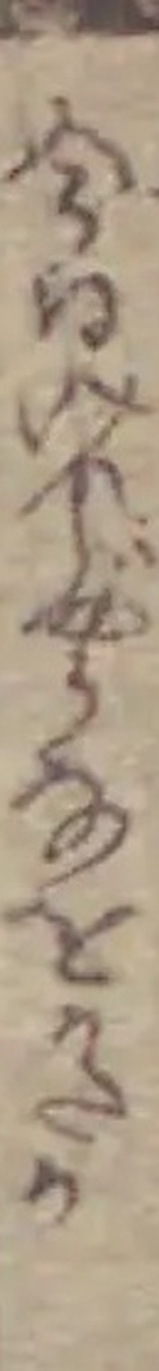今日んじやうなをかたか
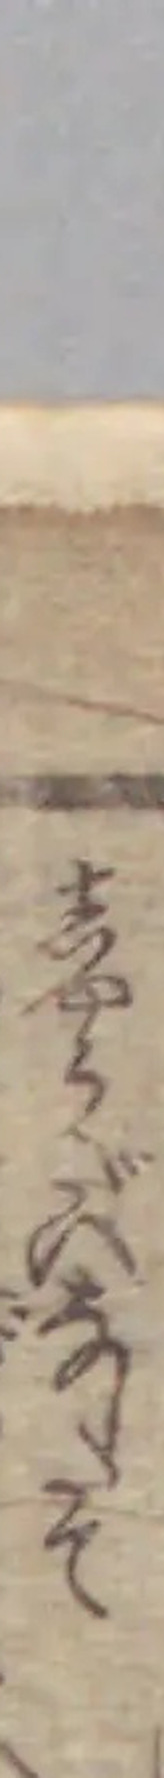しやうだいなしたて
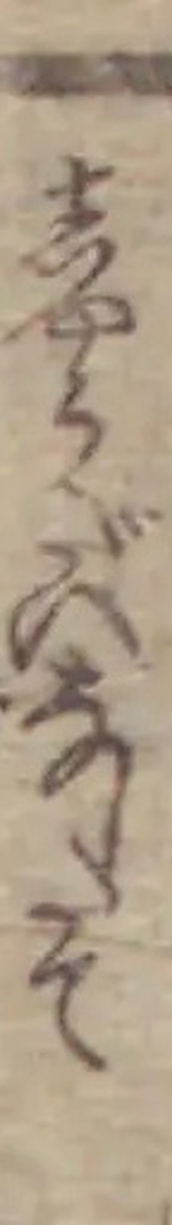しやうだいなしたて
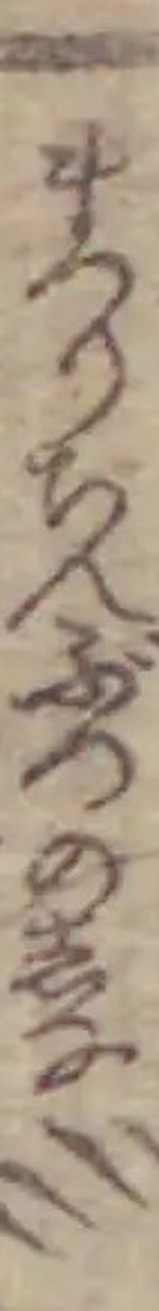まつりちんぶつのしな
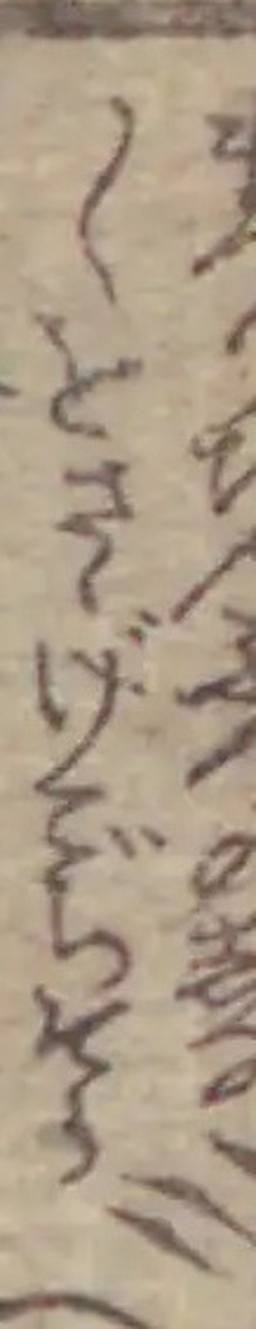〳〵をさゝげごちそう
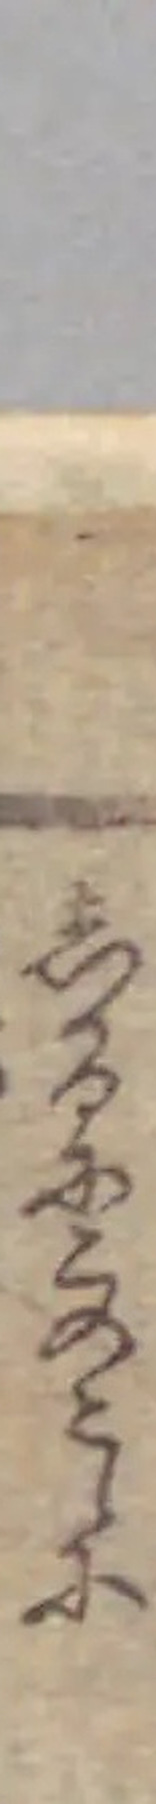しかるにこのとしに
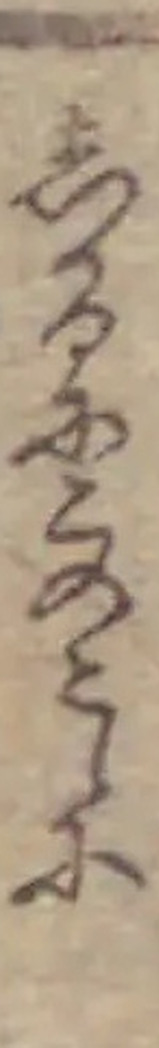しかるにこのとしに
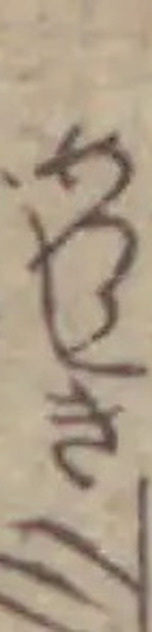めづらしき
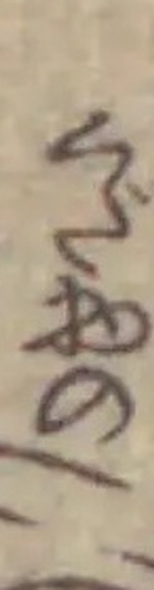くだ物の
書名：奥州咄 3巻
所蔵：国立国会図書館 National Diet Library, JAPAN
